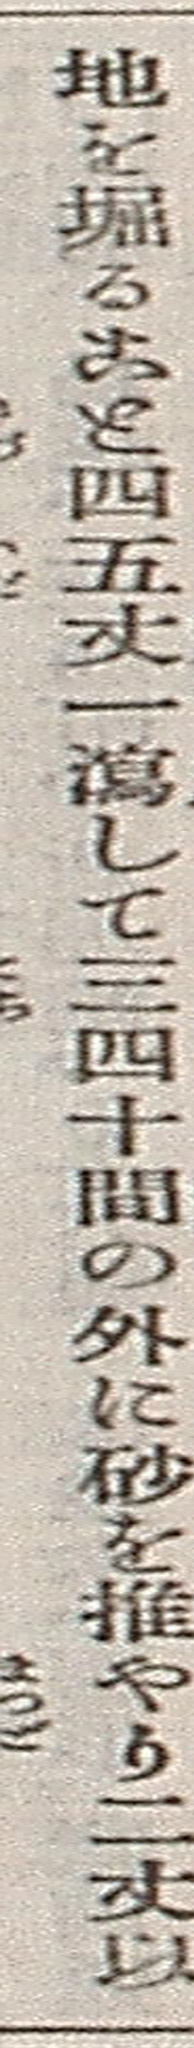地を堀ること四五丈一瀉して三四十間の外に砂を推やり二丈以
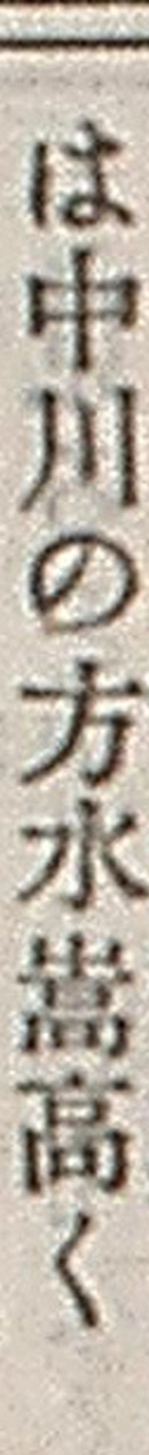は中川の方水嵩高く
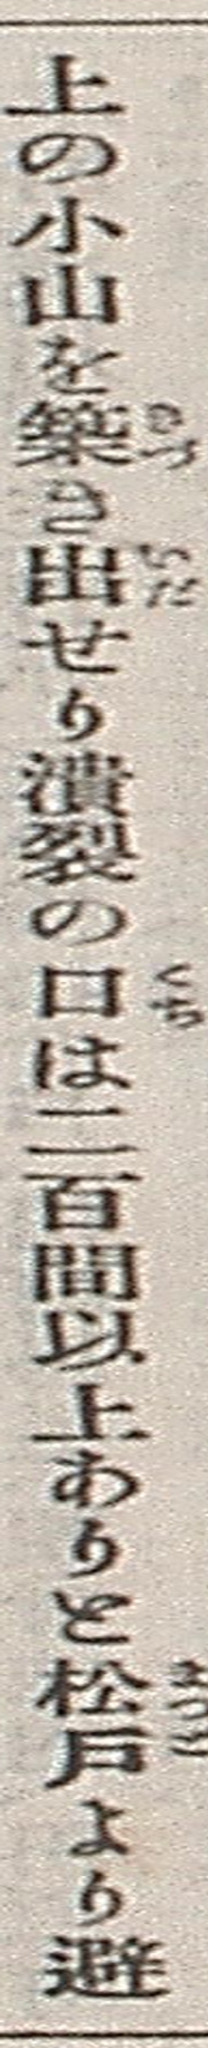上の小山を築き出せり潰裂の口は二百間以上ありと松戸より避
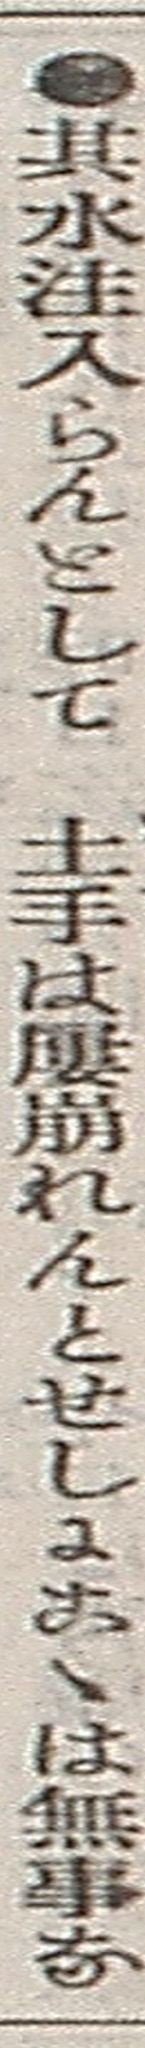●其水注入らんとして土手は廔崩れんとせしにこゝは無事な
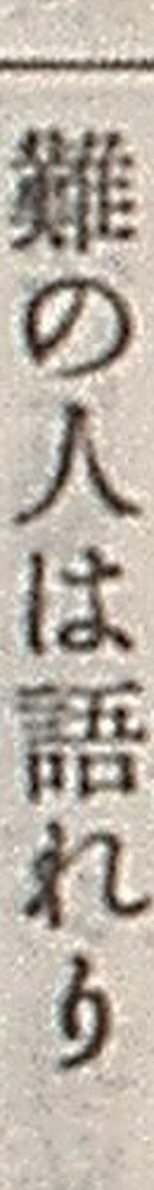難の人は語れり
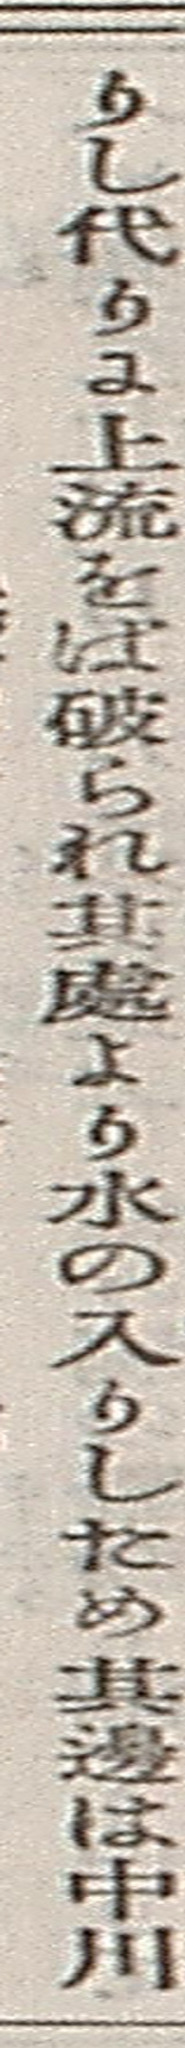りし代りに上流をば破られ其処より水の入りしため其辺は中川
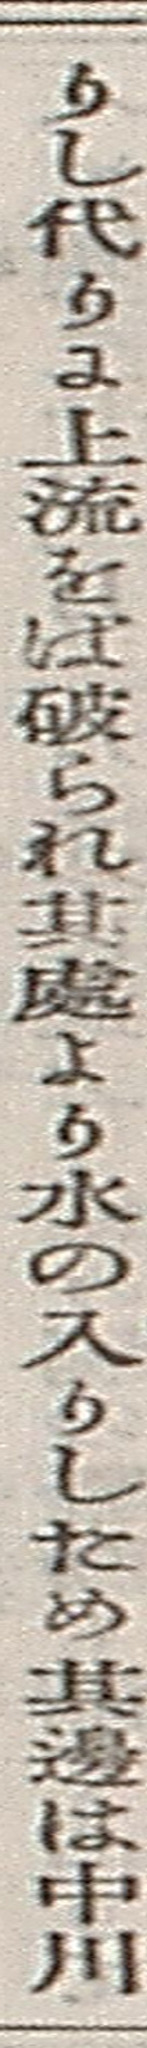りし代りに上流をば破られ其処より水の入りしため其辺は中川
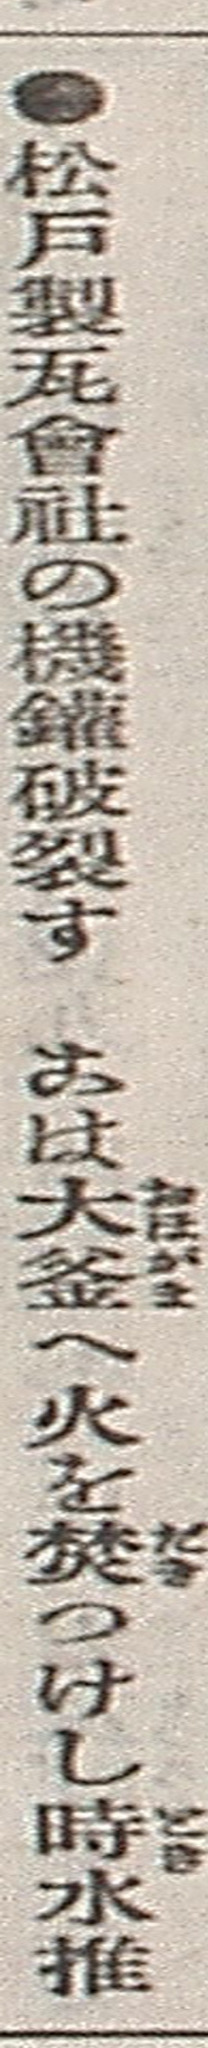●松戸製瓦会社の機鏙破裂すこは大釜へ火を焚つけし時水推
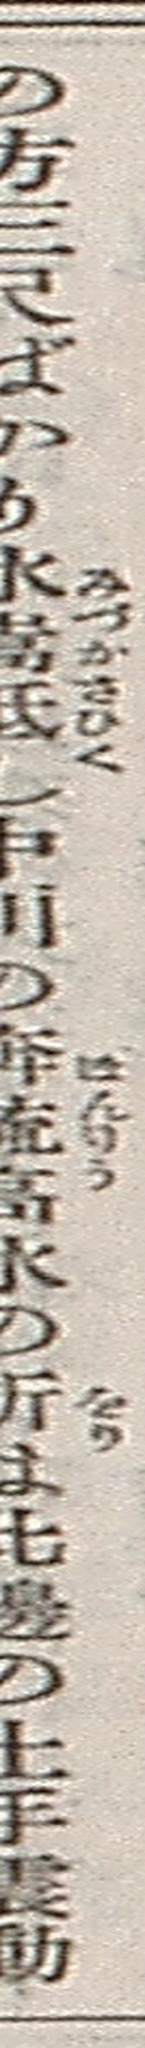の方三尺ばかり水嵩低し中川の奔流高水の折は此辺の土手震動
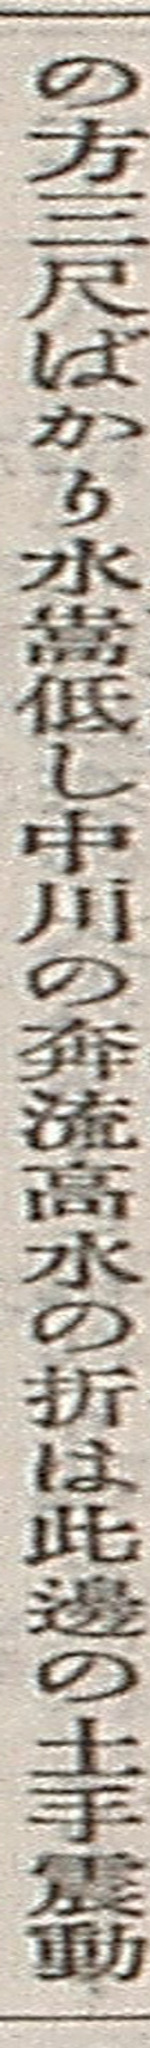の方三尺ばかり水嵩低し中川の奔流高水の折は此辺の土手震動
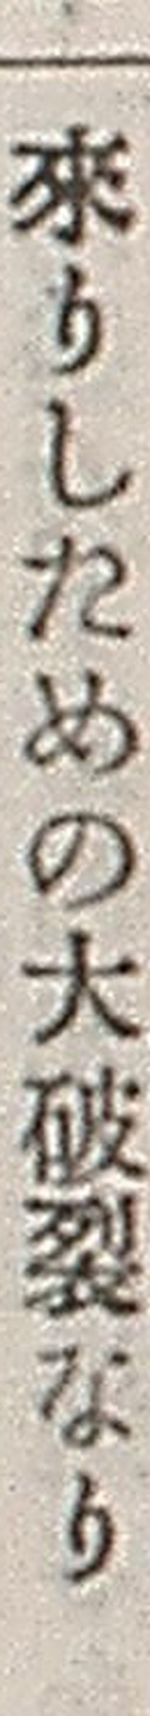来りしための大破裂なり
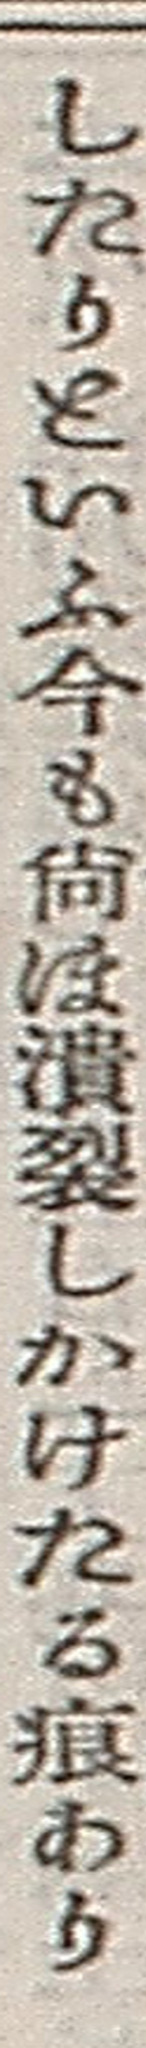したりといふ今も尚ほ潰裂しかけたる痕あり
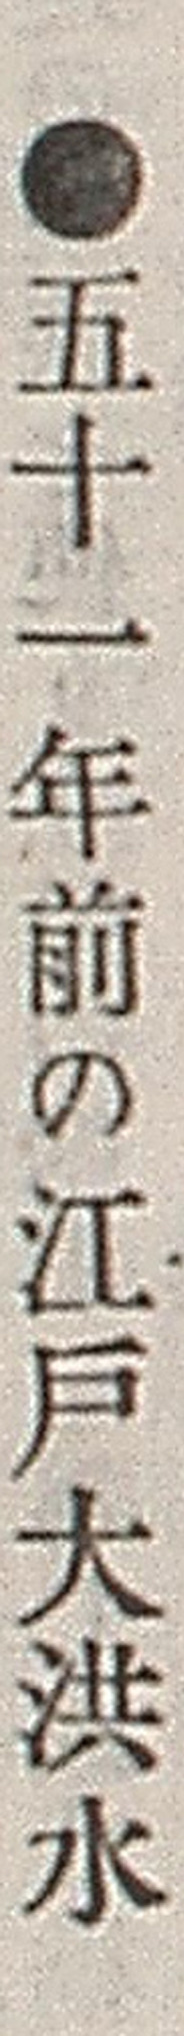●五十一年前の江戸大洪水
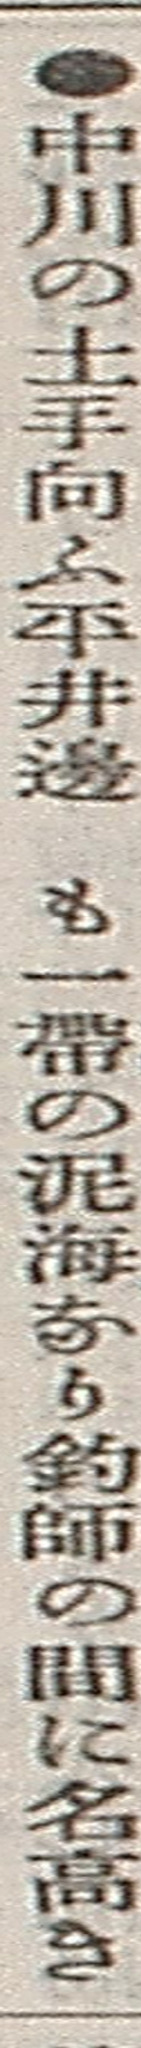●中川の土手向ふ平井辺も一帯の泥海なり釣師の間に名高き
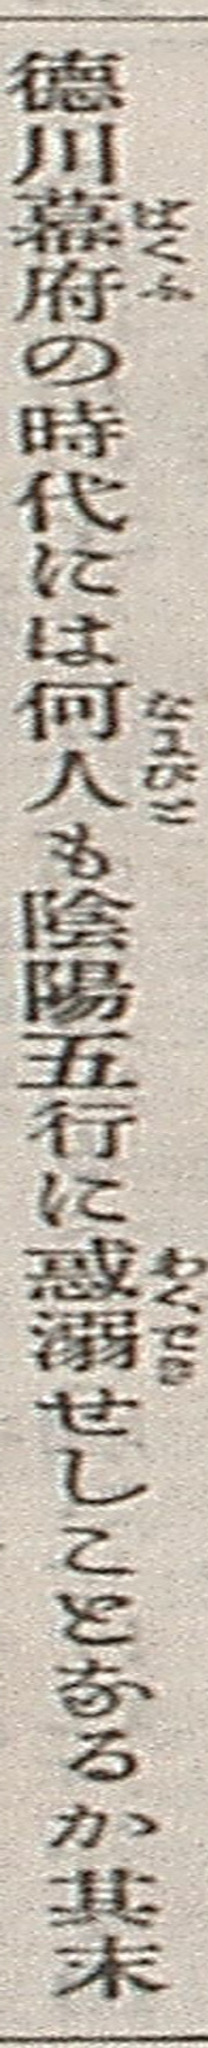徳川幕府の時代には何人も陰陽五行に惑溺せしことなるか其末
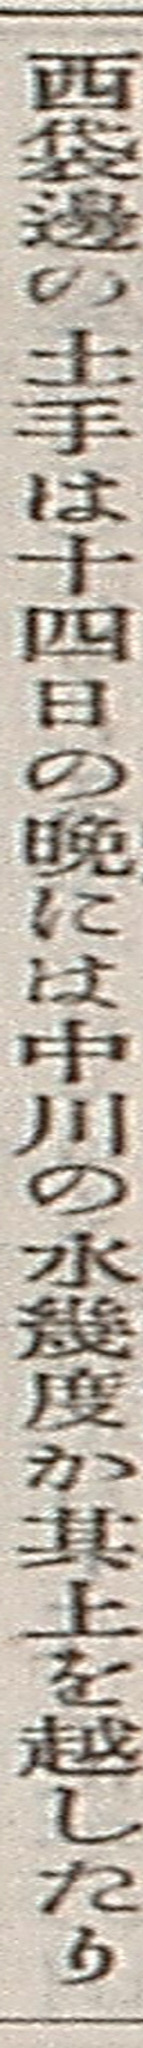西袋辺の土手は十四日の晩には中川の水幾度か其上を越したり
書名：風俗畫報臨時増刊第百二十四號　洪水地震被害録（上）
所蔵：東京大学地震研究所図書室 Earthquake Research Institute Library, The University of Tokyo, JAPAN
